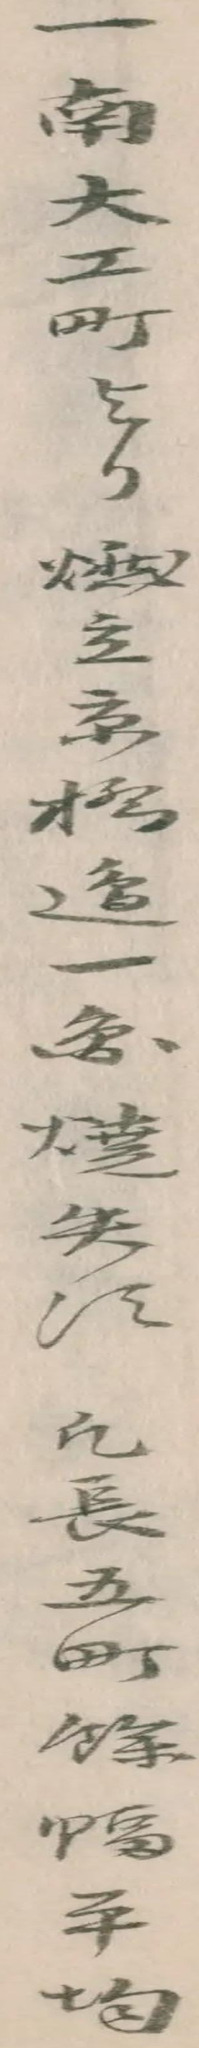一南大工町より燃立京橋辺一円焼失す凡長五町余幅平均
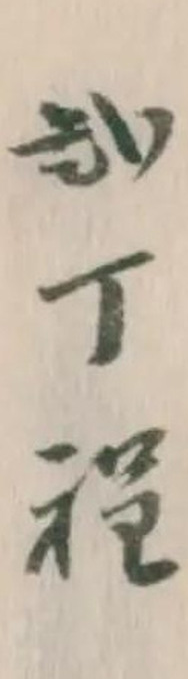弐丁程
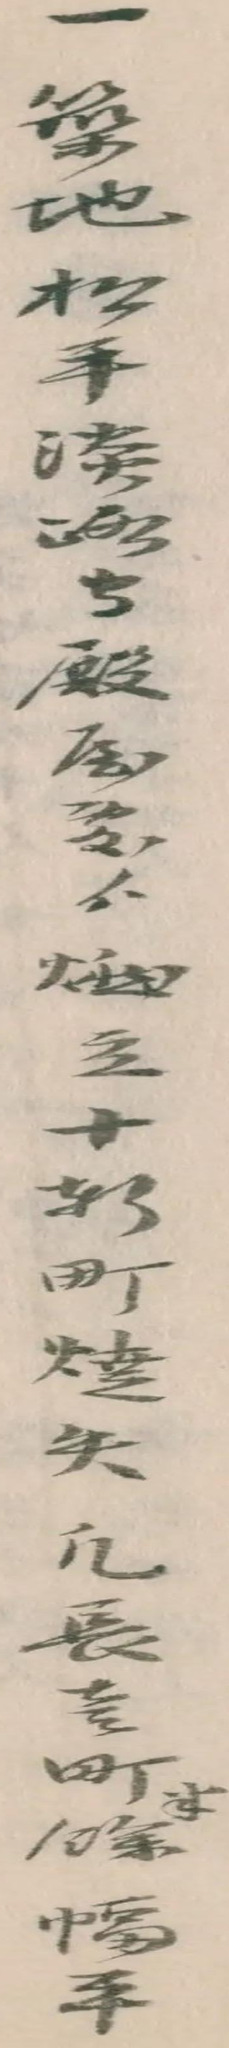一築地松平淡路守殿屋敷ゟ燃立十軒町焼失凡長壱町半余幅平
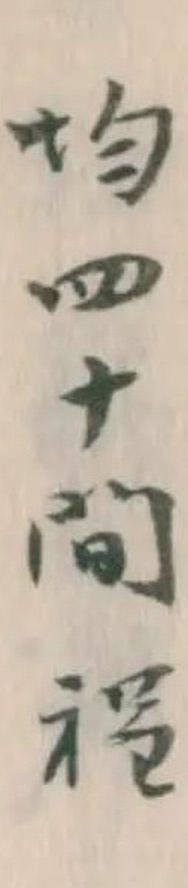均四十間程
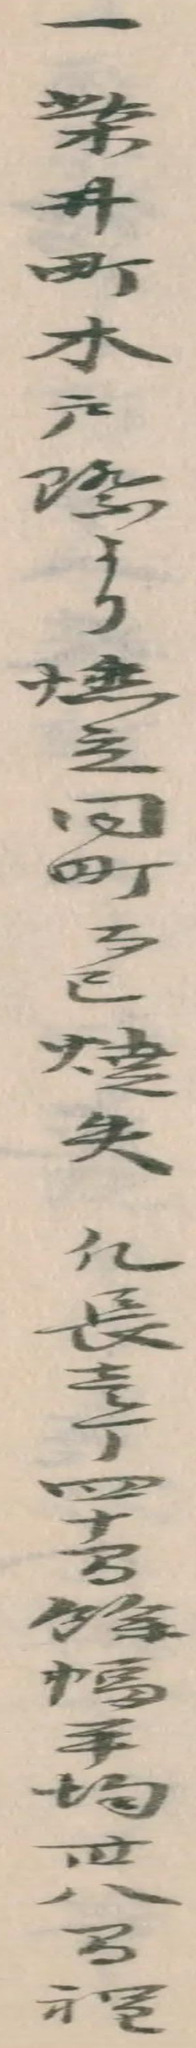一柴井町木戸際より燃立同町而已焼失凡長壱丁四十間余幅平均丗八間程
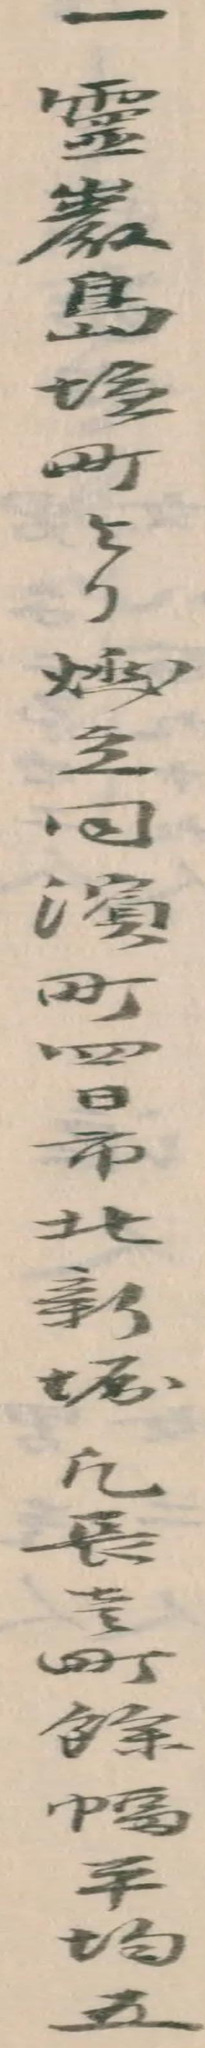一霊巖島塩町より燃立同浜町四日市北新堀凡長壱町余幅平均五
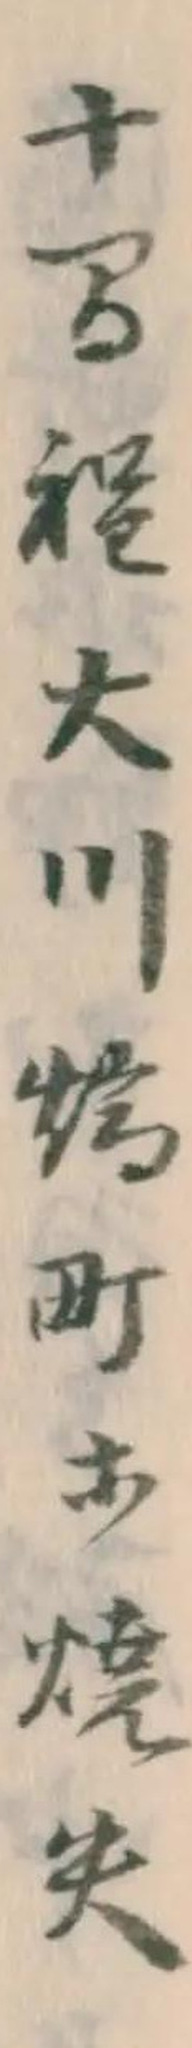十間程大川端町等焼失
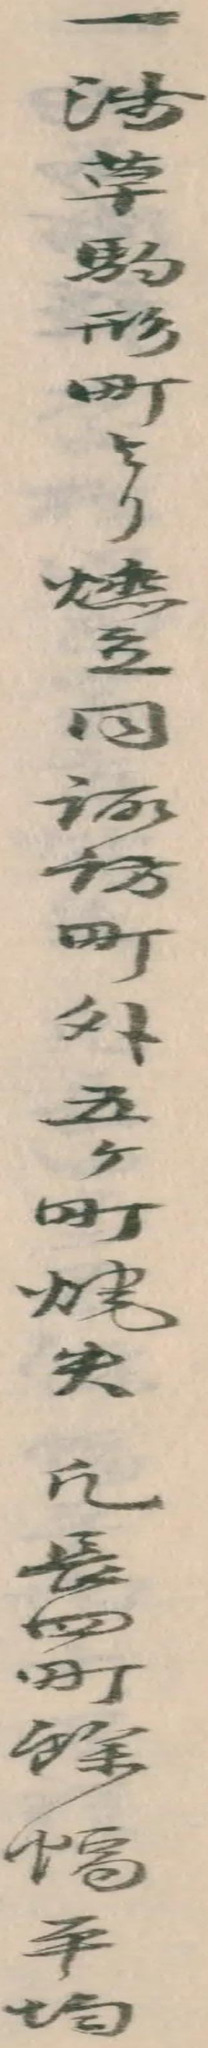一浅草駒形町より燃立同諏訪町外五ヶ町焼失凡長四町余幅平均
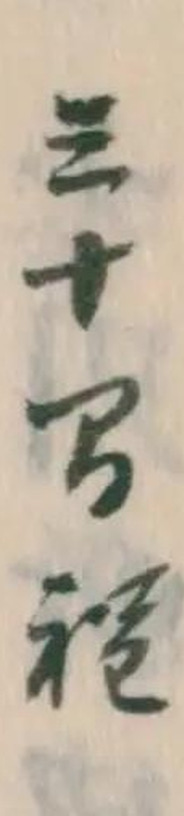三十間程
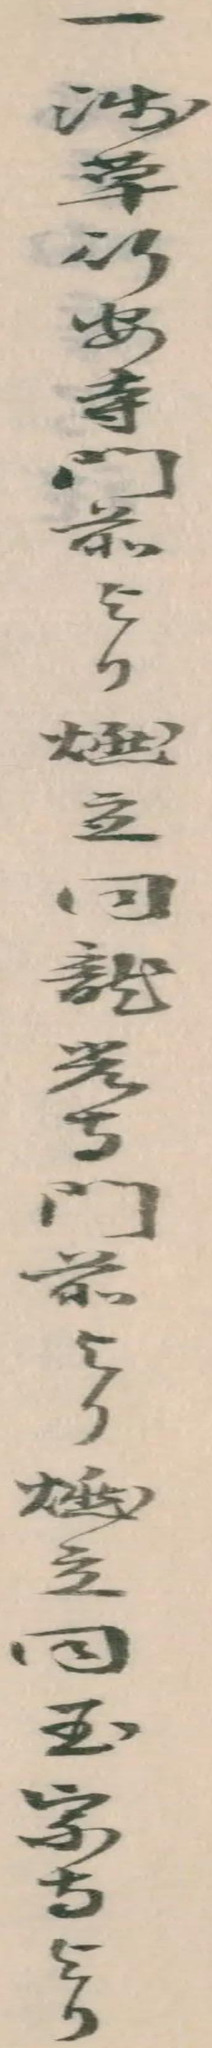一浅草行安寺門前より燃立同龍光寺門前より燃立同玉宗寺より
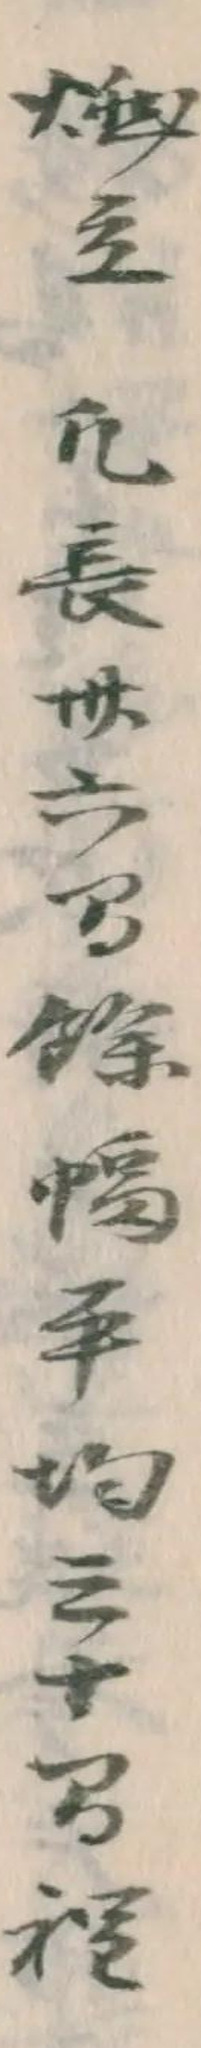燃立凡長卅六間余幅平均三十間程
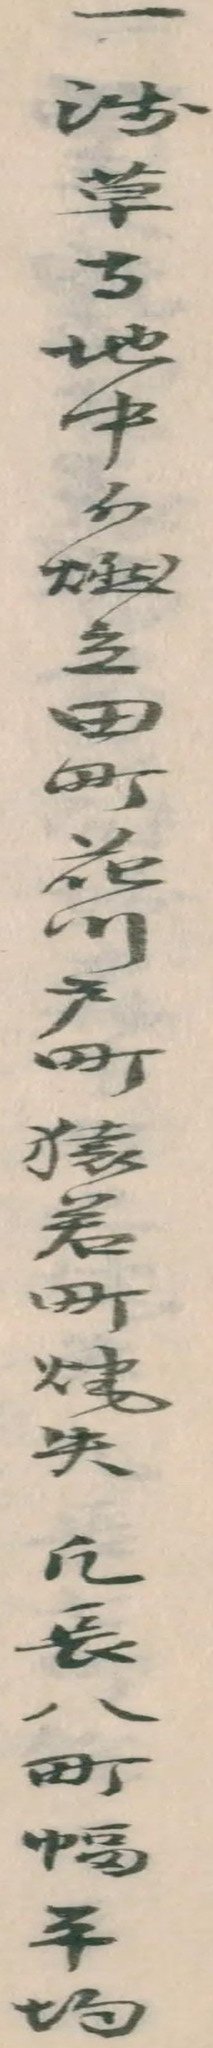一浅草寺地中ゟ燃立田町花川戸町猿若町焼失凡長八町幅平均
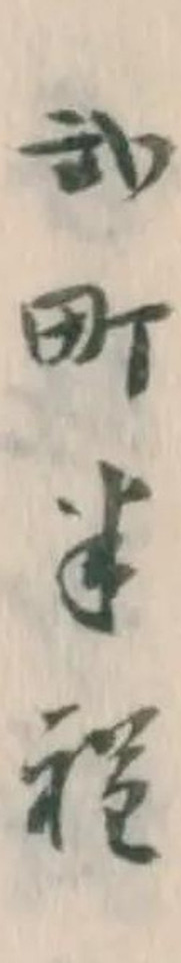弐町半程
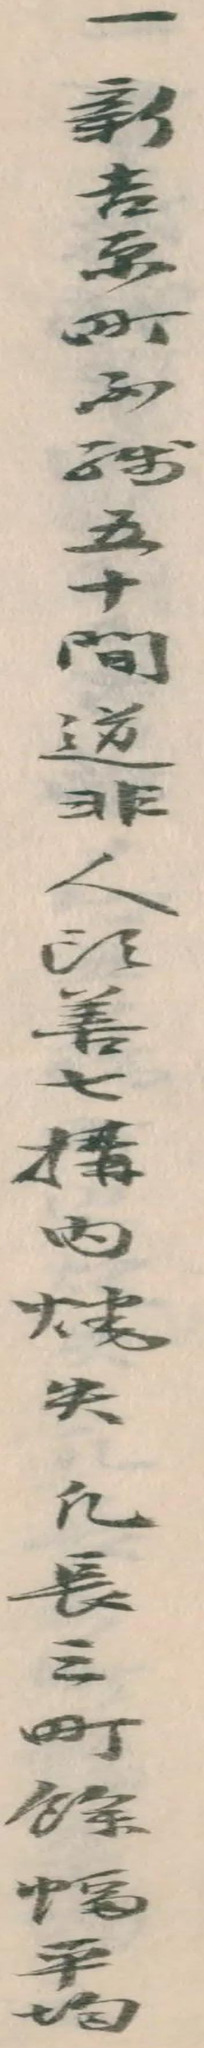一新吉原町不残五十間道非人頭善七構内焼失凡長三町余幅平均
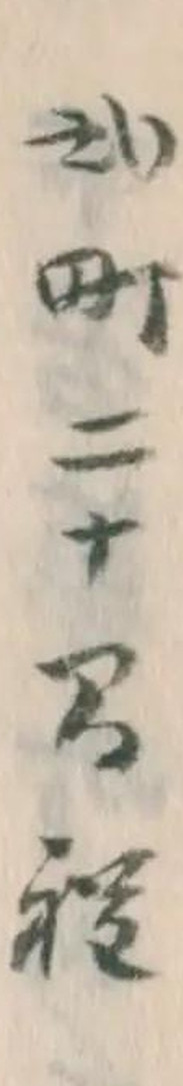弐町二十間程
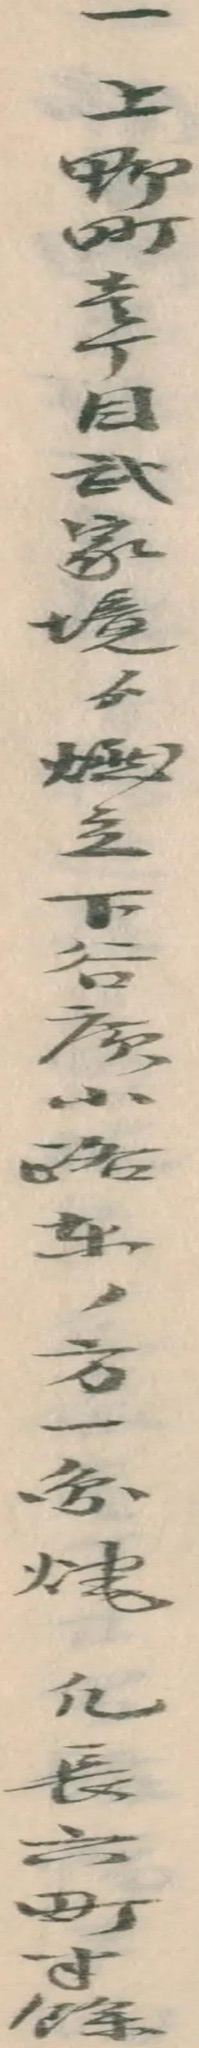一上野町壱丁目武家境ゟ燃立下谷広小路東ノ方一円焼凡
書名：地災撮要. 巻7-9(地震之部)
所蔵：国立国会図書館 National Diet Library, JAPAN
